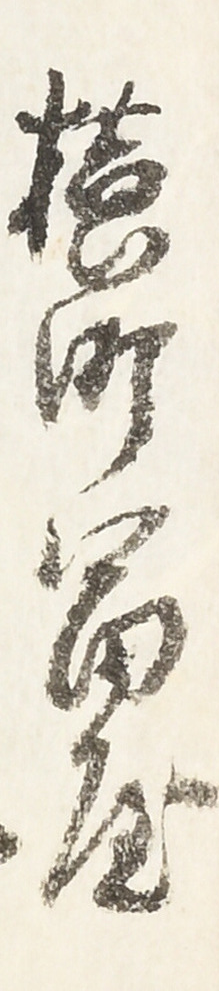横町冨屋
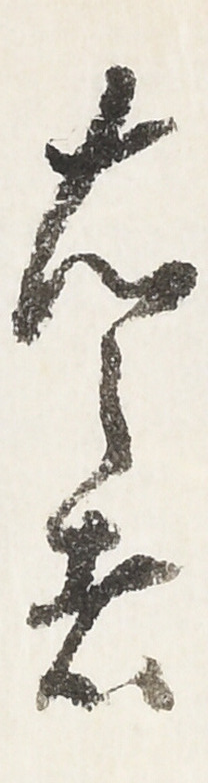右之者
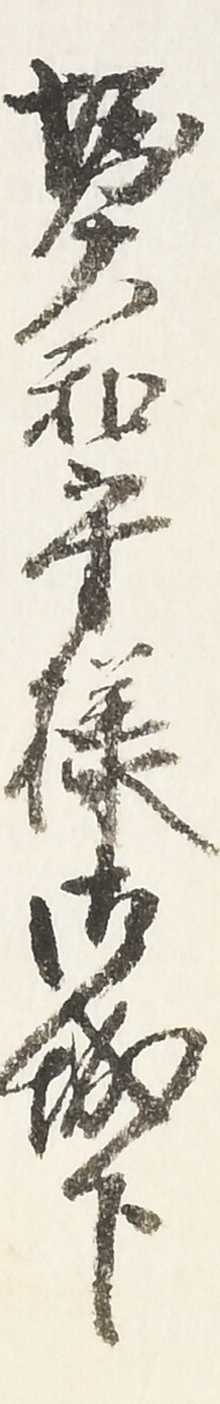堀大和守様御城下
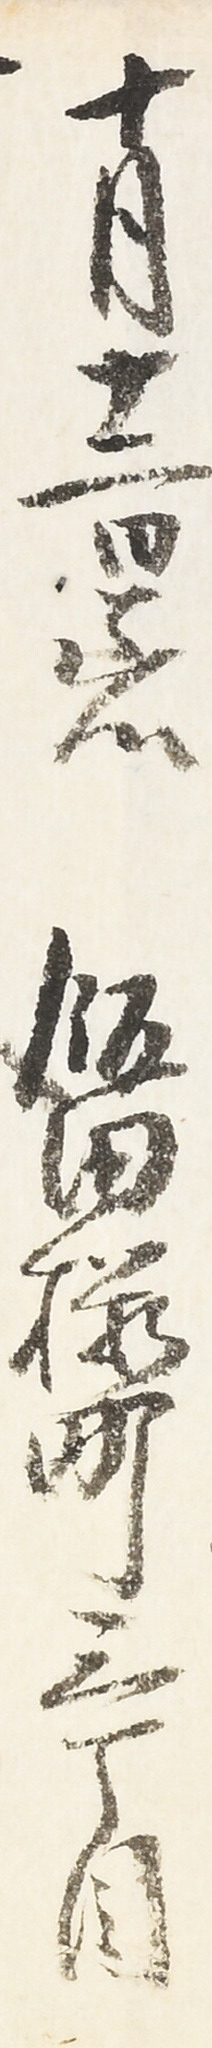十月十二日着飯田桜町三丁目
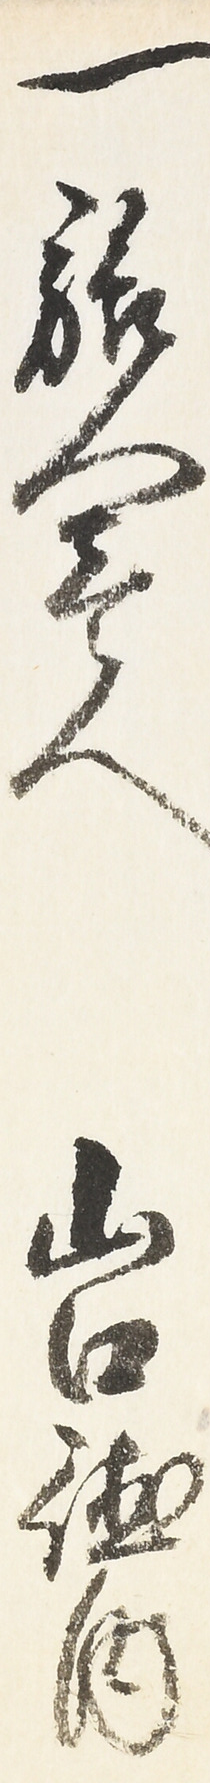一旅人壱人山口徳内
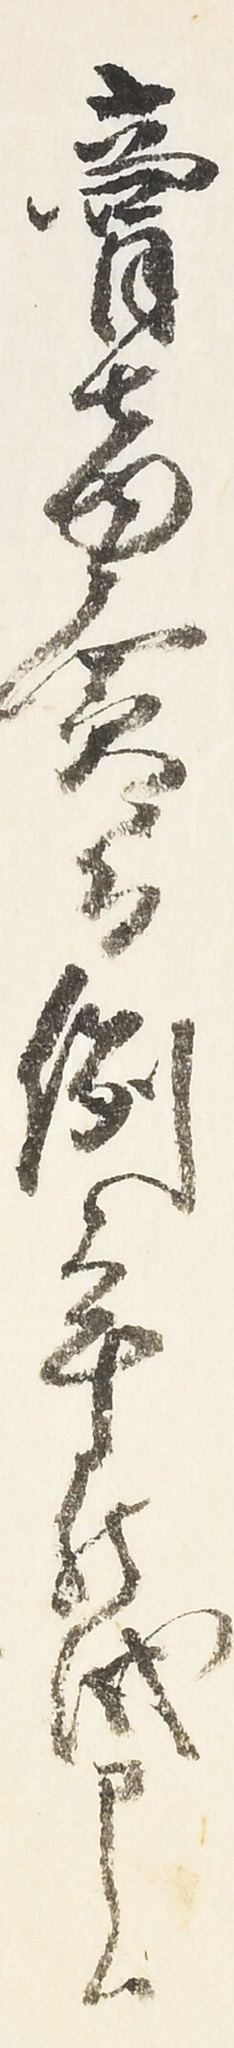膏商売ニ而例年罷越申候
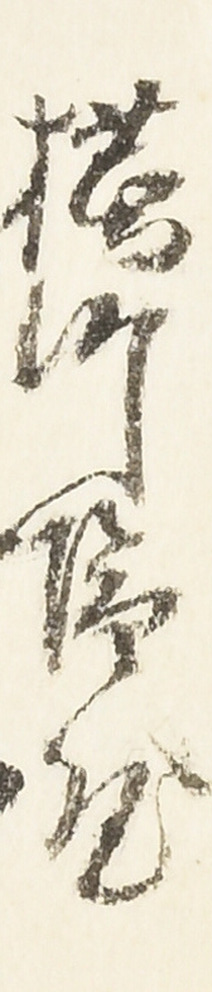横町冨屋
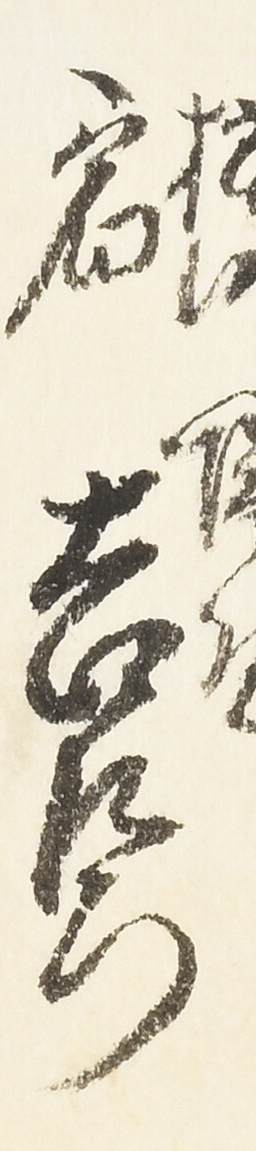宿吉左衛門
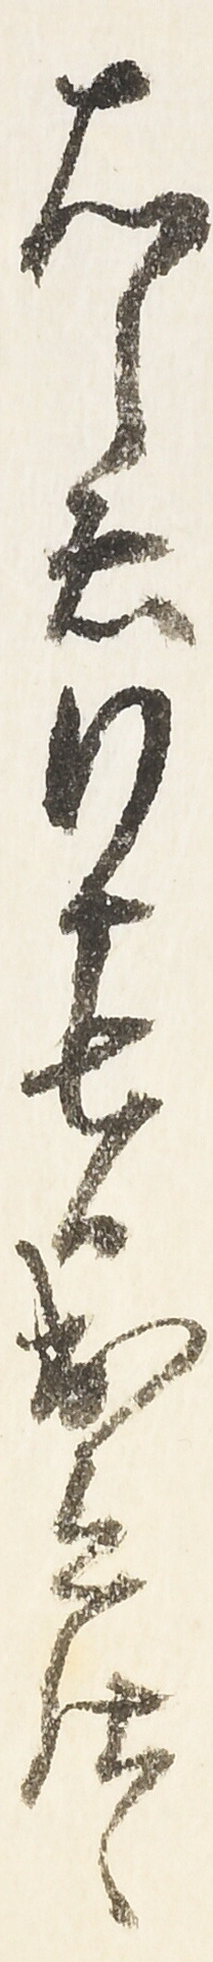右之者同十七日出立仕候
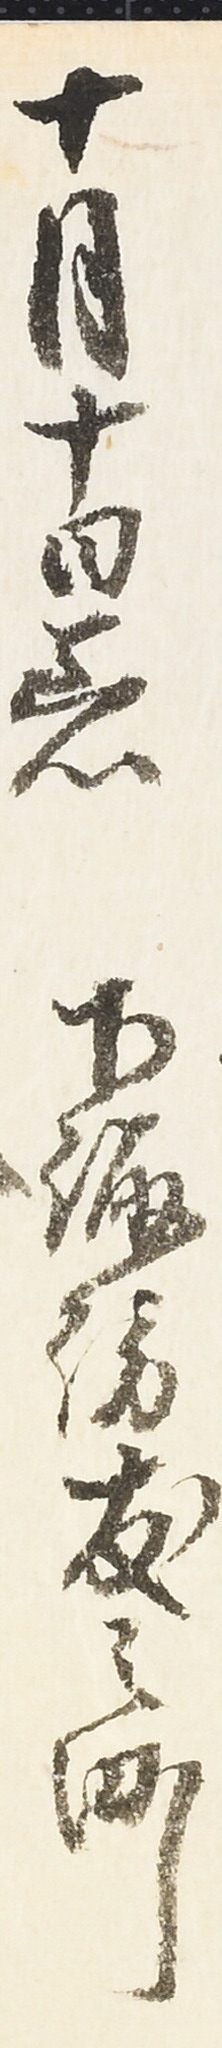十月十四日着下諏訪友之町
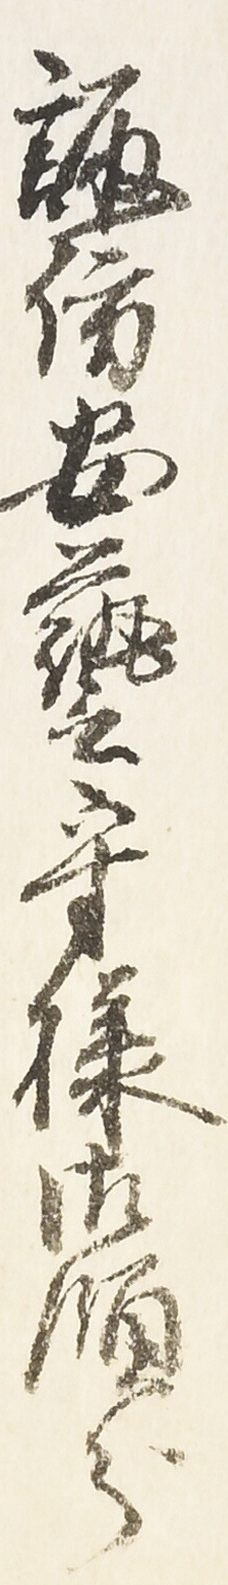諏訪安芸守様御領分
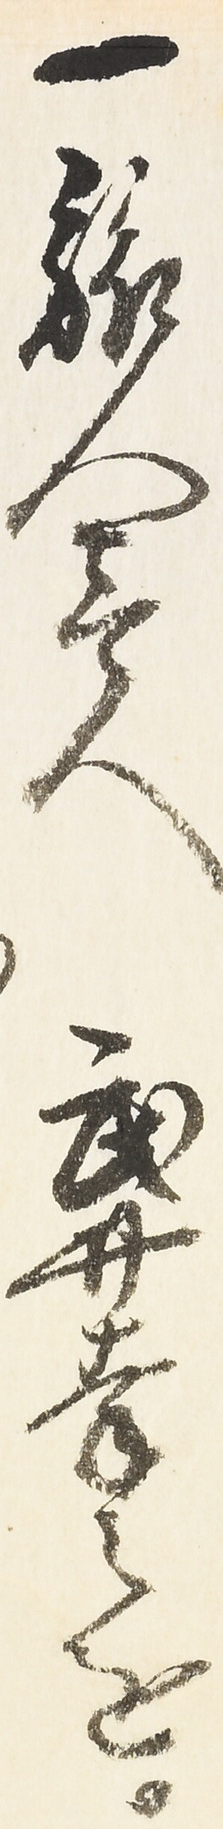一旅人壱人武井幸之進。
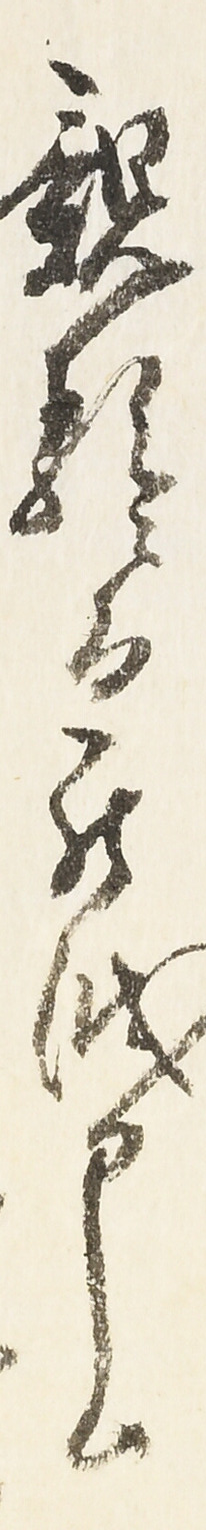親類ニ而罷越申候
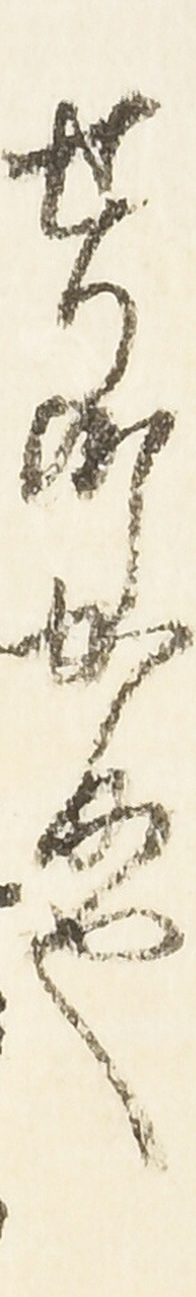せり町かめや
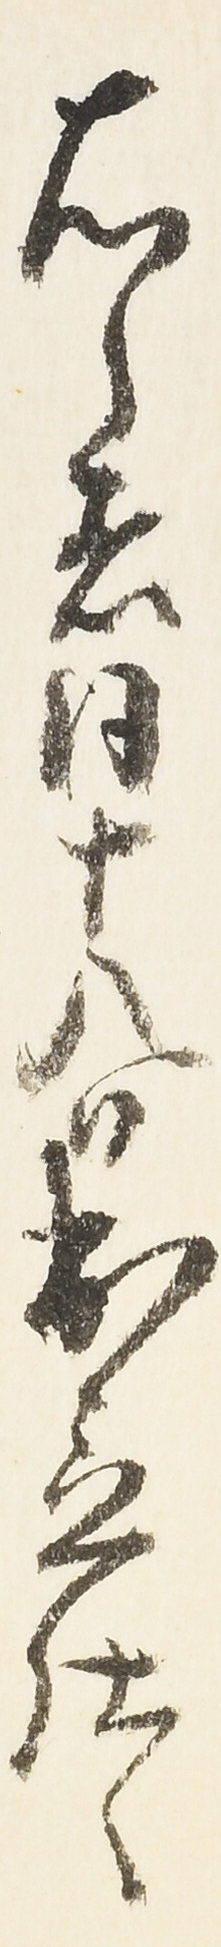右之者同十八日出立仕候
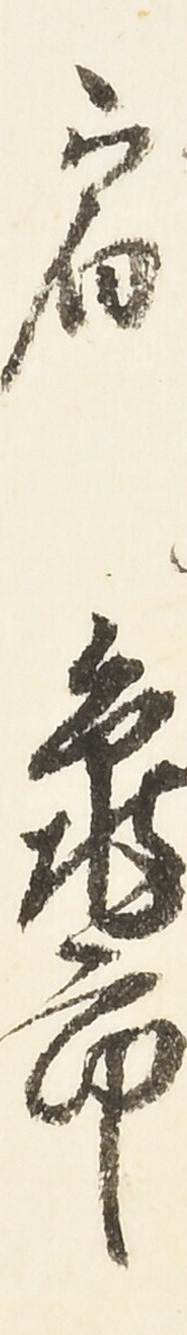宿亀市
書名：町中旅人泊控帳
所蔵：伊那市立高遠町図書館・合同会社AMANE
